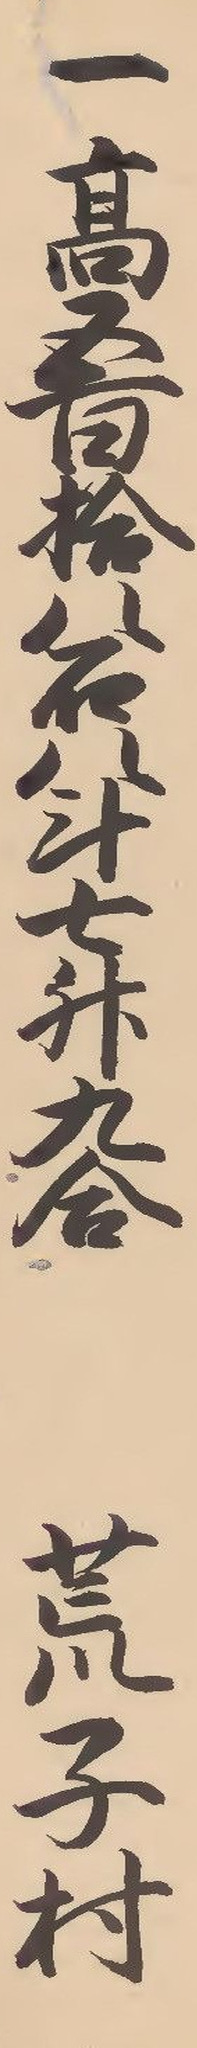一高五百拾八石八斗七升九合荒子村

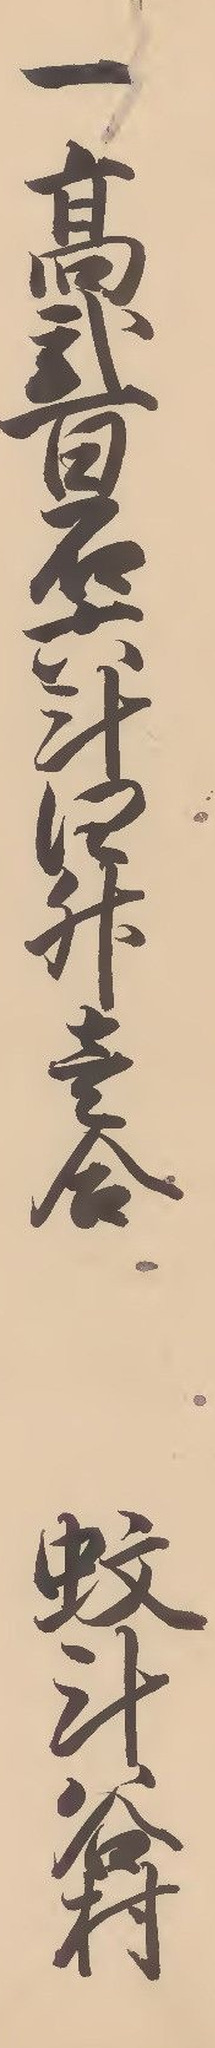一高弐百石六斗四升壱合蚊斗谷村
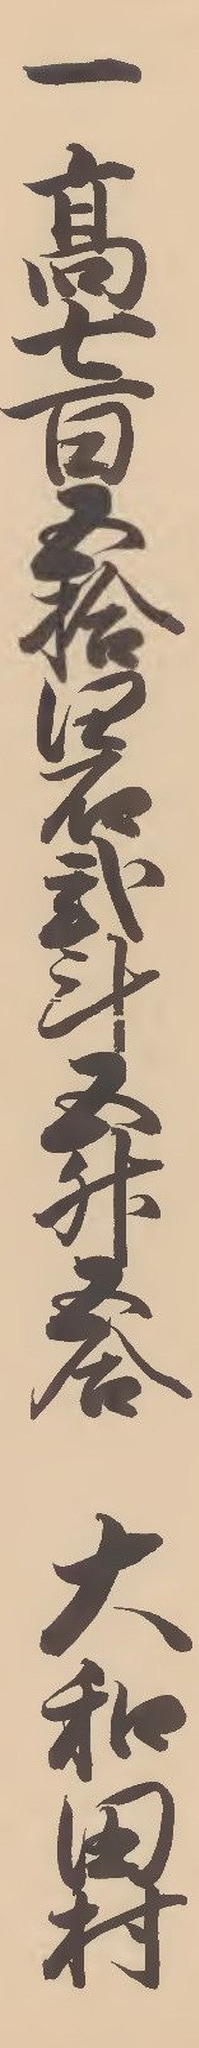一高七百五拾四石弐斗五升五合大和田村
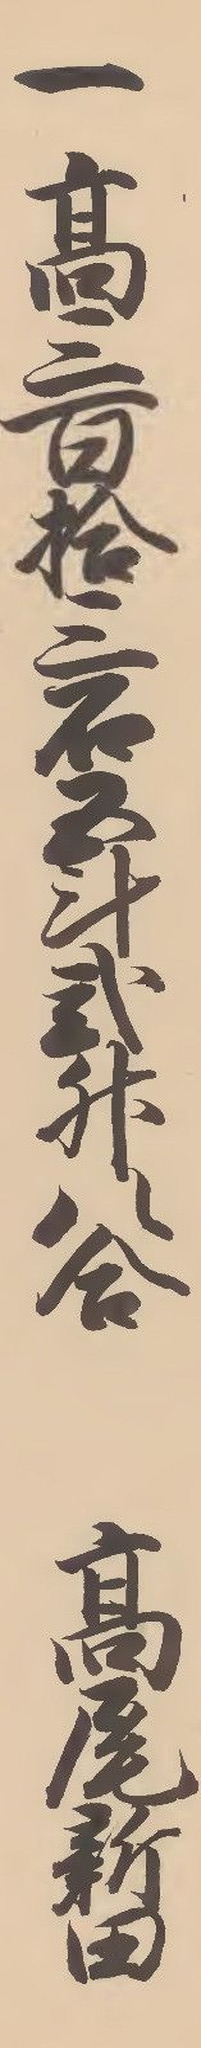一高三百拾三石五斗弐升八合高尾新田
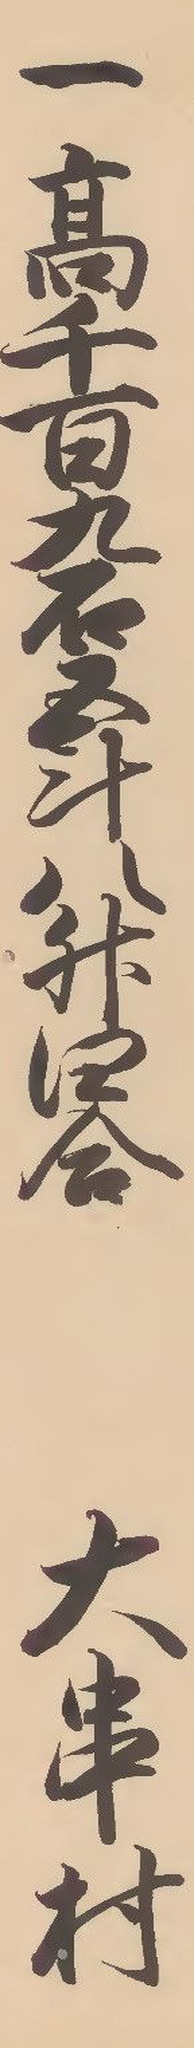一高千百九石五斗八升四合大串村
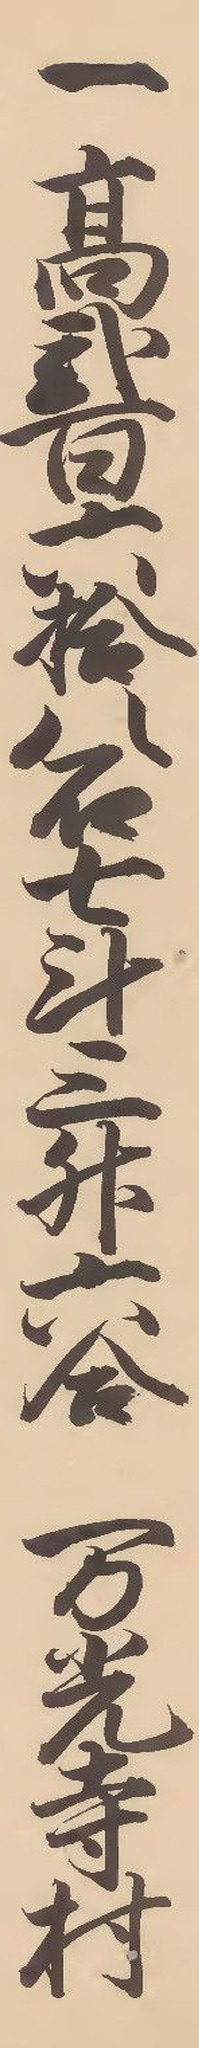一高弐百六拾八石七斗三升六合万光寺村
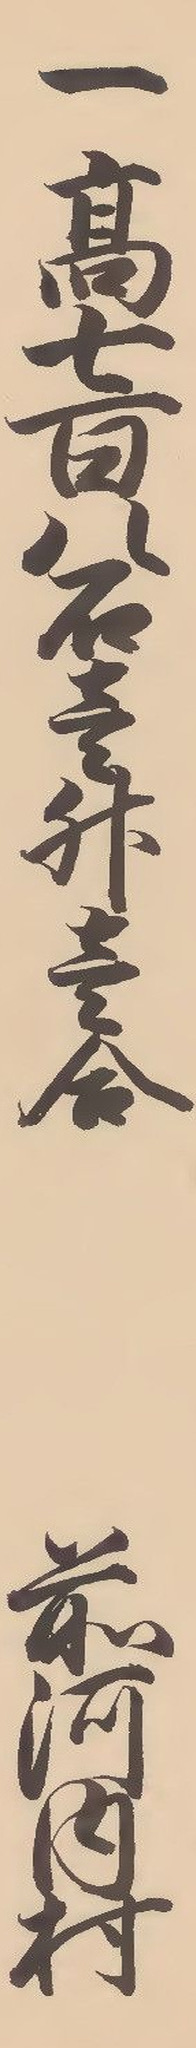一高七百八石壱升壱合前河内村
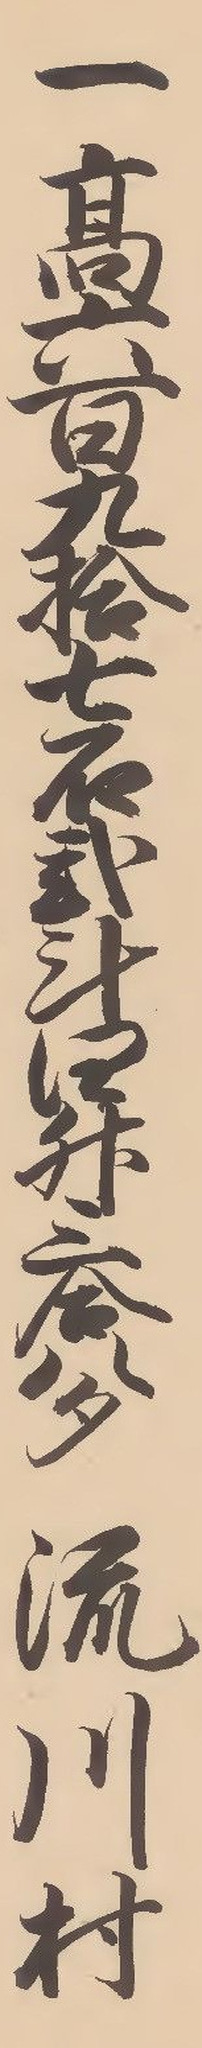一高六百九拾七石弐斗四升三合八勺流川村
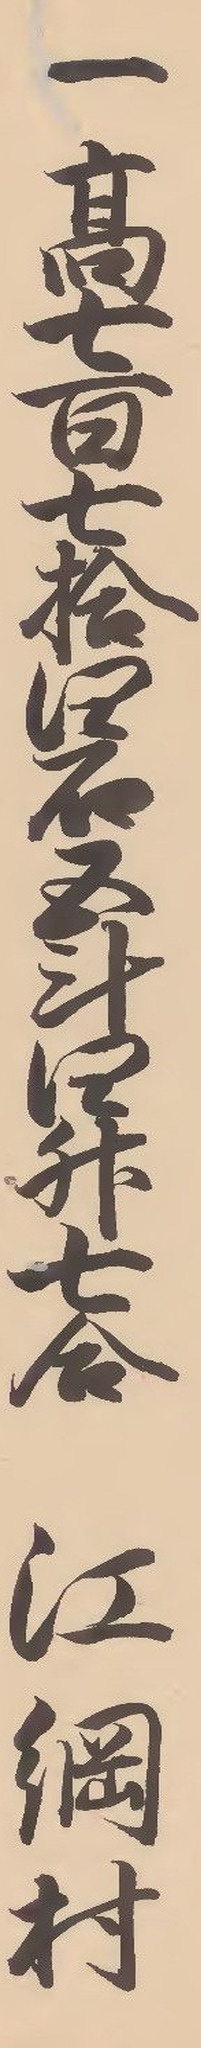一高七百七拾四石五斗四升七合江綱村

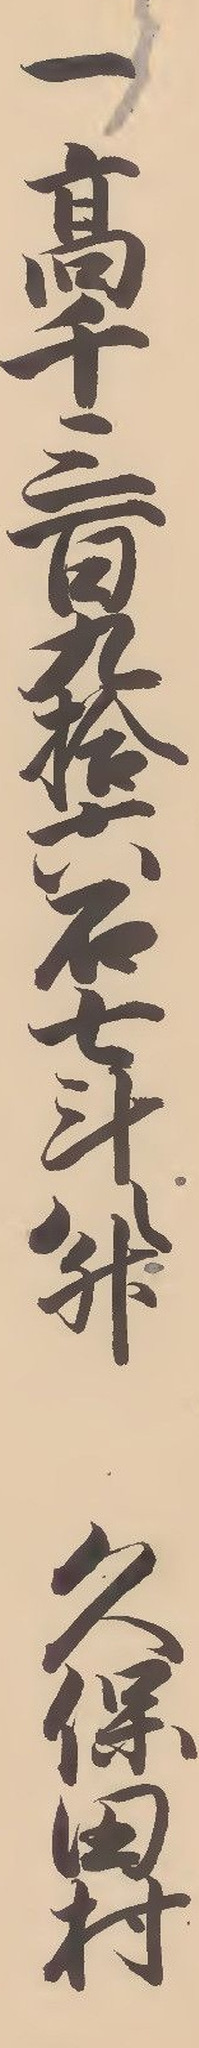一高千三百九拾六石七斗八升久保田村
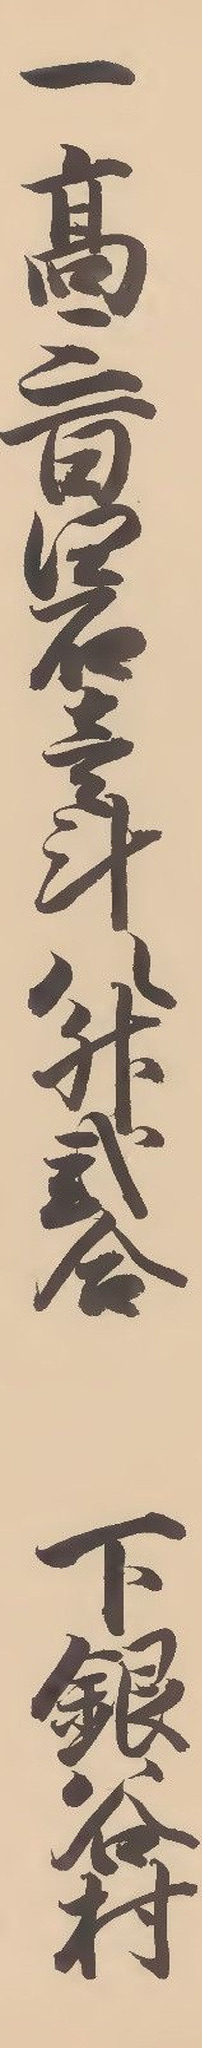一高三百四石壱斗八升弐合下銀谷村
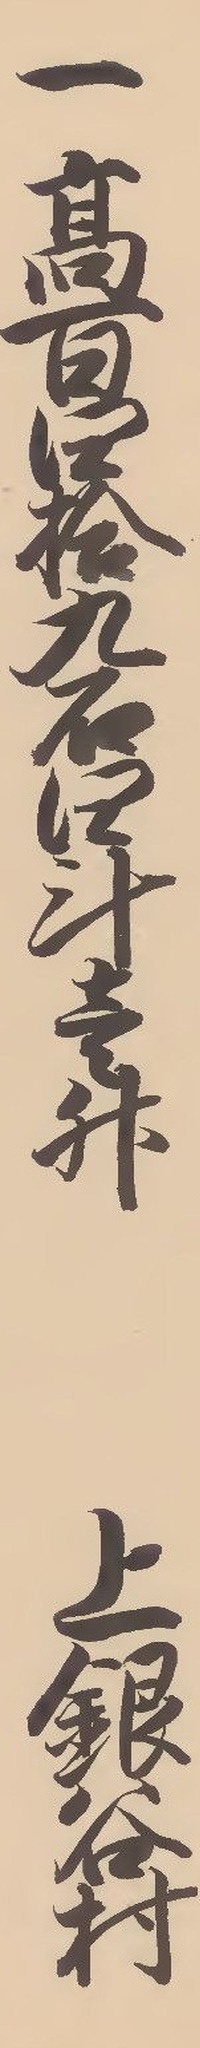一高百四拾九石四斗壱升上銀谷村
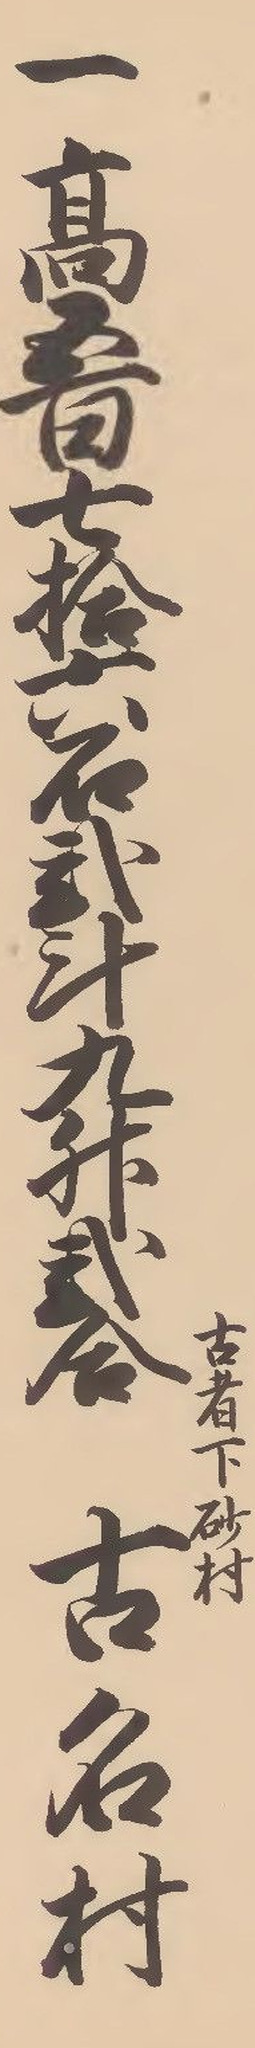一高五百七拾六石弐斗九升弐合古名村
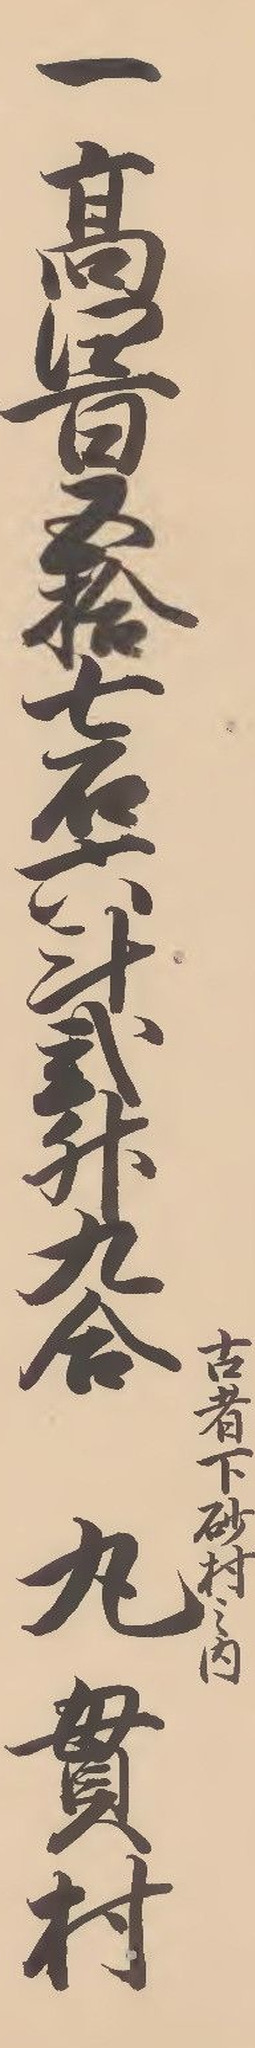一高四百五拾七石六斗弐升九合丸貫村
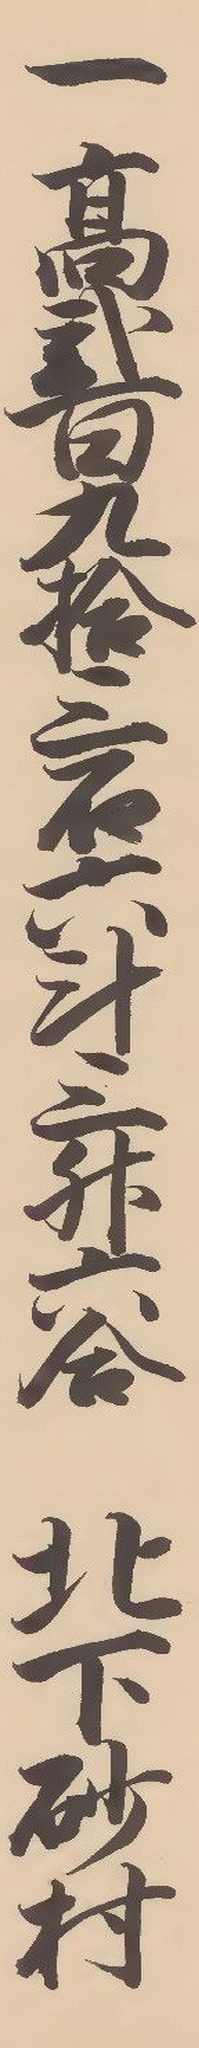一高弐百九拾三石六斗三升六合北下砂村
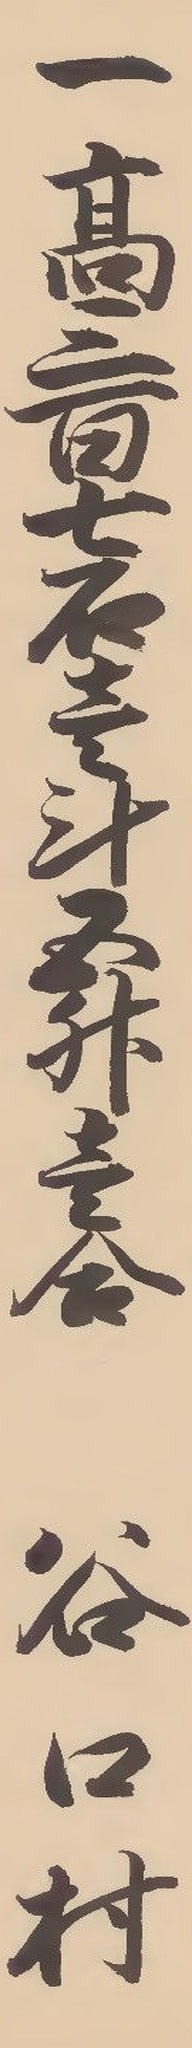一高三百七石壱斗五升壱合谷口村
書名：武蔵国郷帳　下
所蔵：国立公文書館 National Archives of Japan
